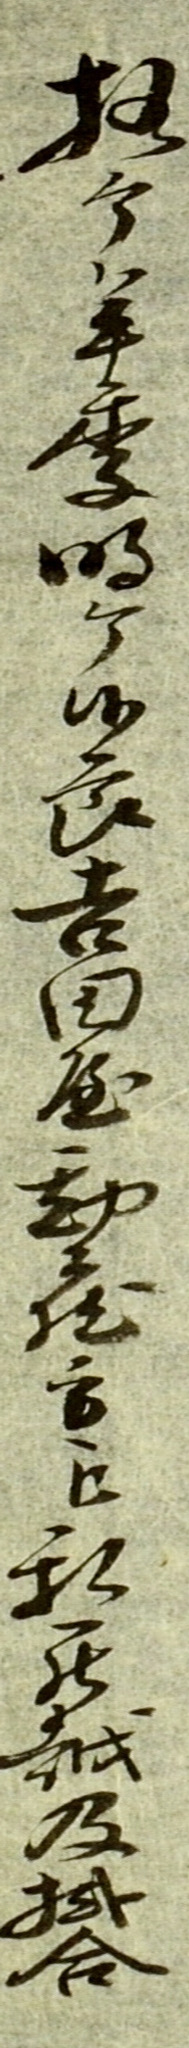拾ケ年季明ケ候節吉田屋勘蔵方江私罷越及掛合
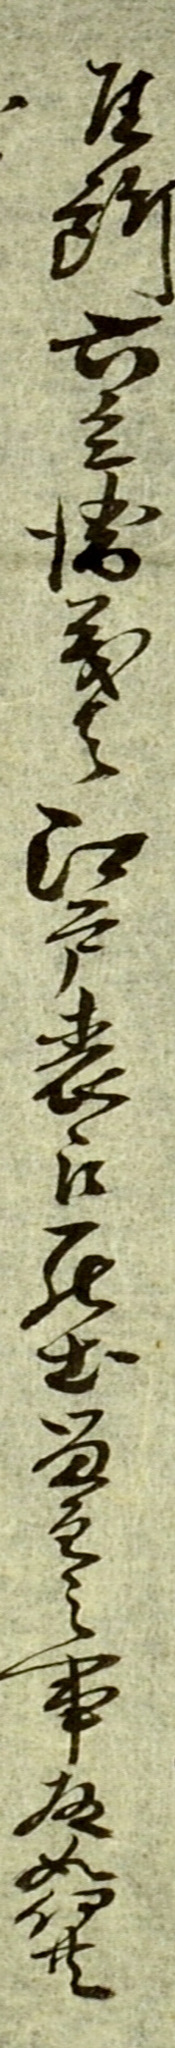候所六兵衛義者江戸表江罷出留主之事故如何共
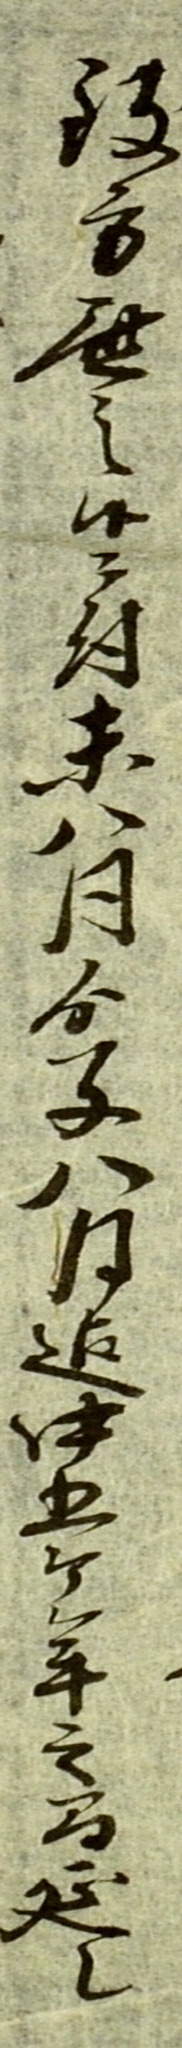致方無之候ニ付未八月ゟ子八月迄中五ケ年間延し
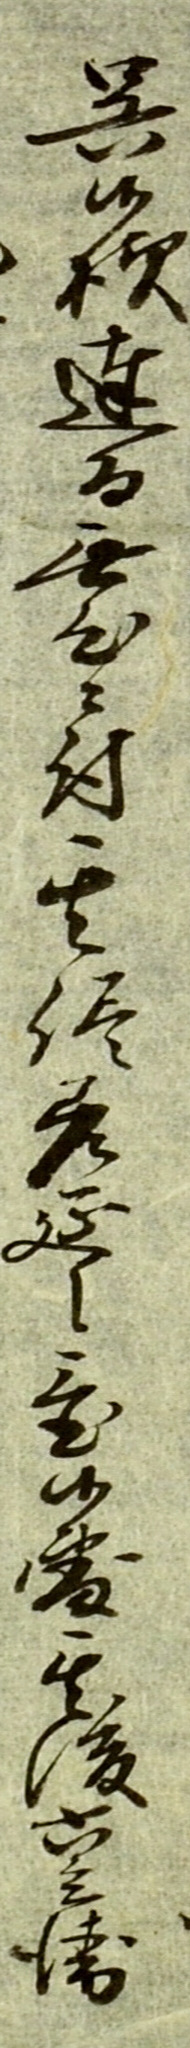呉候様達而無心ニ付其儘差延し置候処其後六兵衛
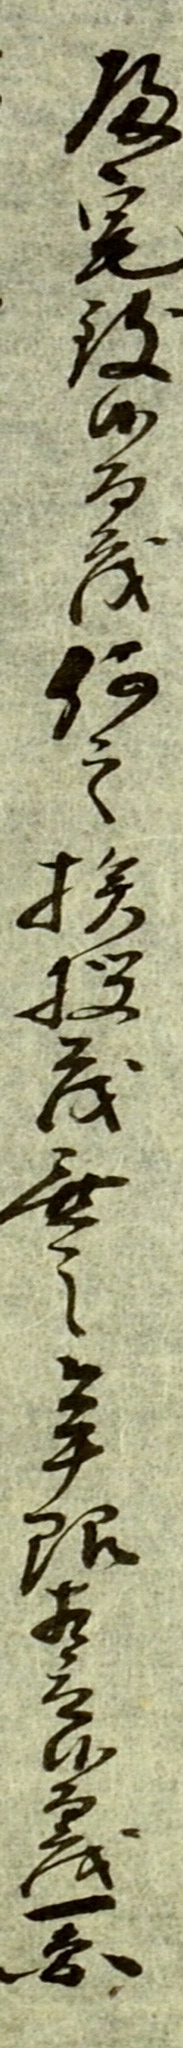帰宅致候而茂何之挨拶茂無之年限相立候而茂一円
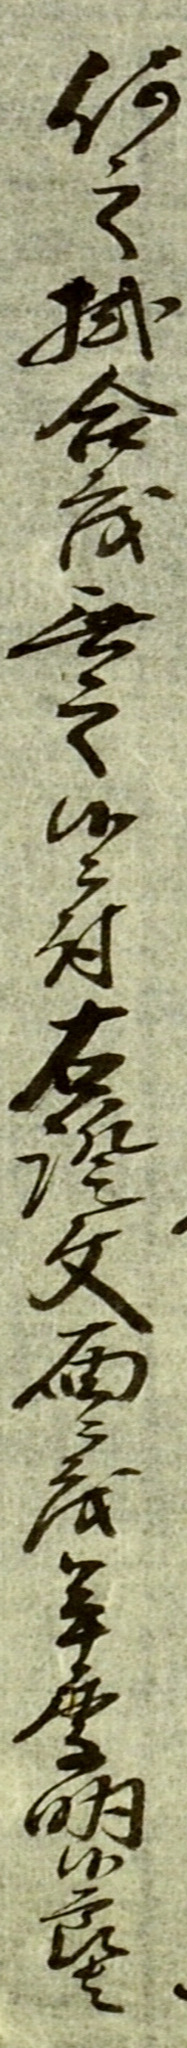何之掛合茂無之候ニ付右証文面ニ茂年季明候節者
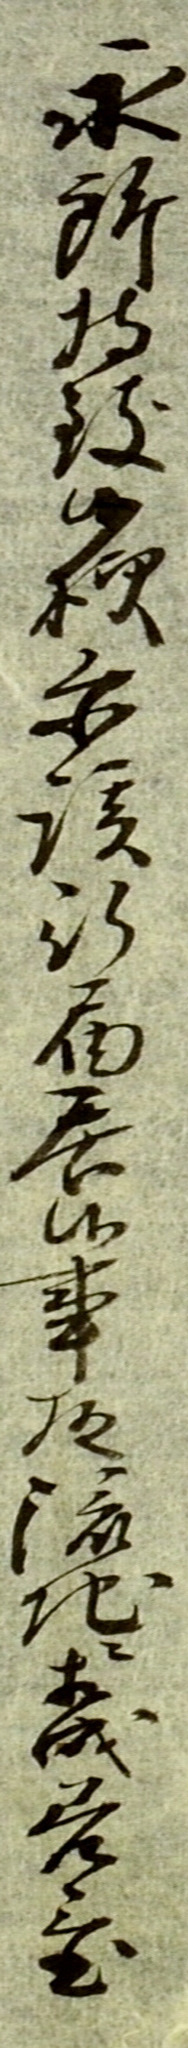永所持致候様示談行届居候事故流地ニ相成差置
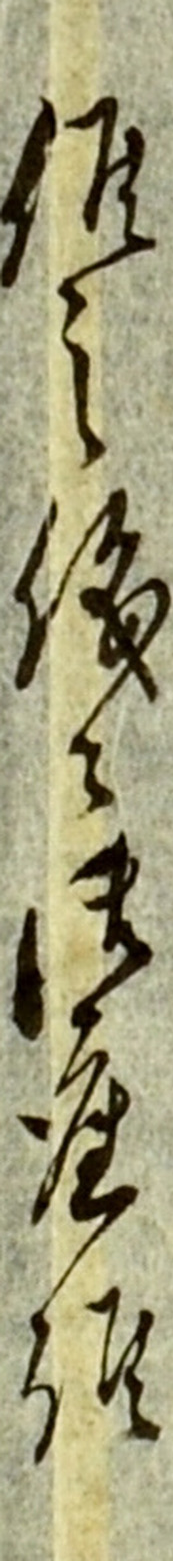候之儀ニ御座候
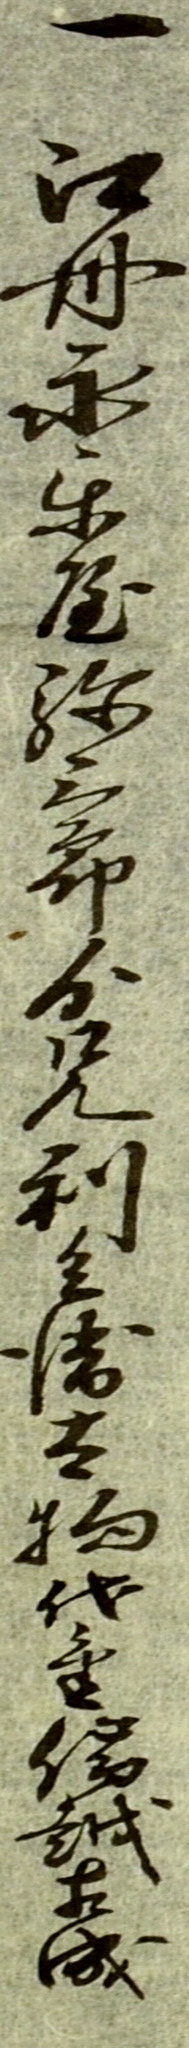一江州永楽屋弥三郎ゟ兄利兵衛太物代金借越相成
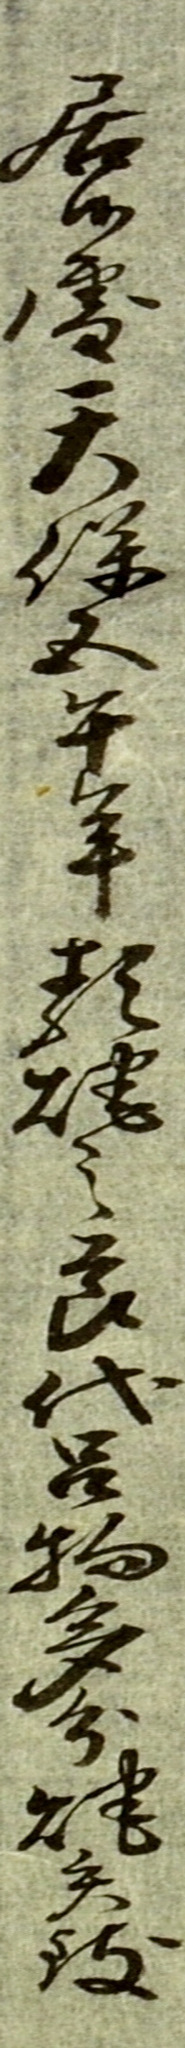居候処天保五午年類焼之節代呂物多分焼失致
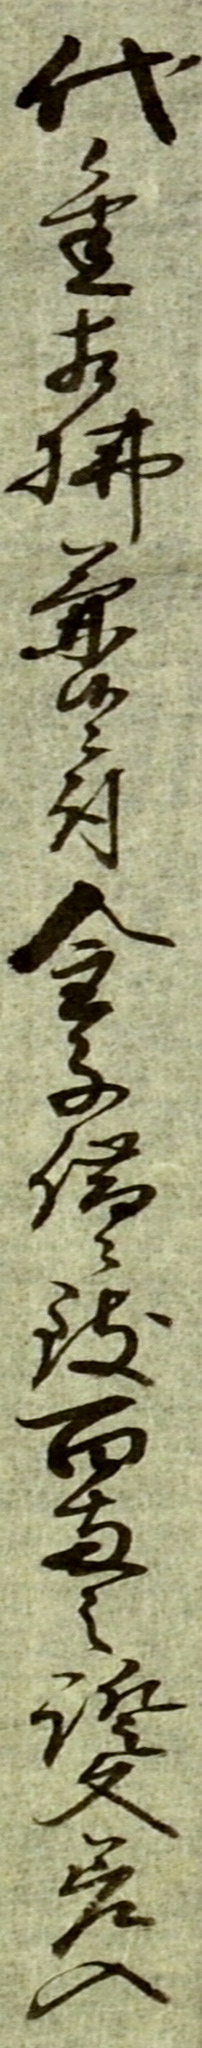代金相払兼候ニ付金子借ニ致百両之証文差入
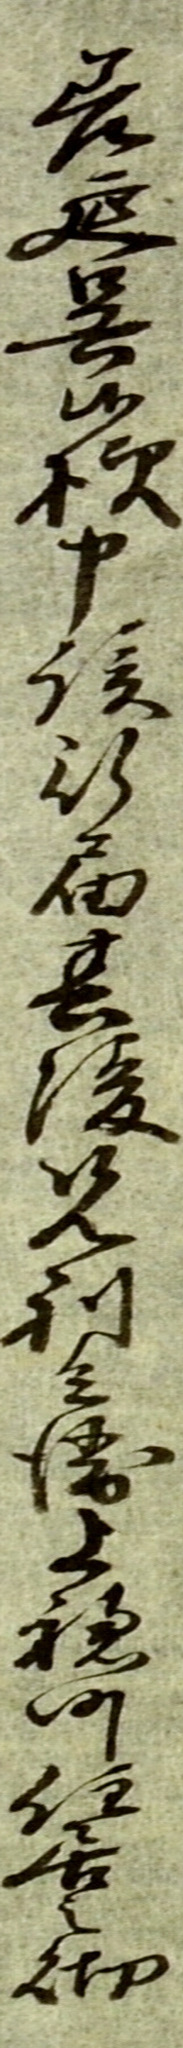差延呉候様申談行届其後兄利兵衛上穂町住居之砌
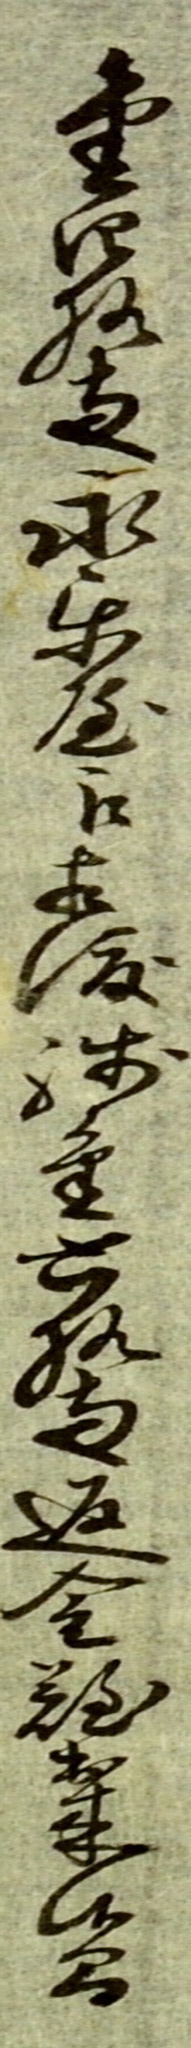金四拾両永楽屋江相渡残金六拾両返金難出来候間
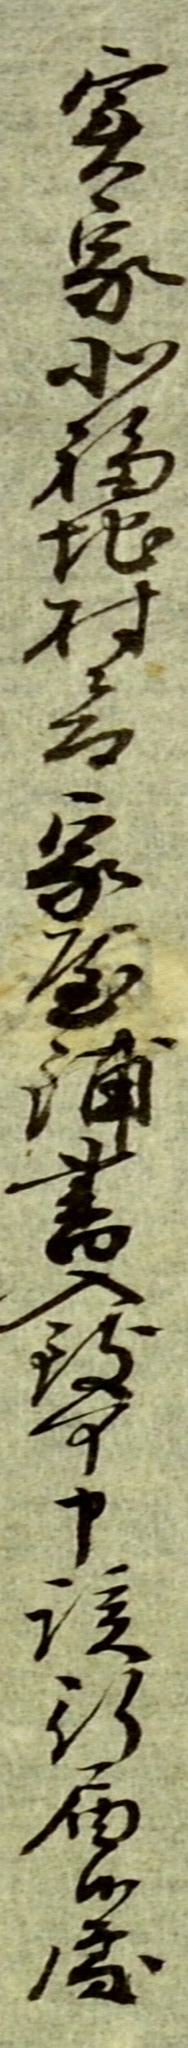実家北福地村ニ而家屋鋪書入致可申談行届候処
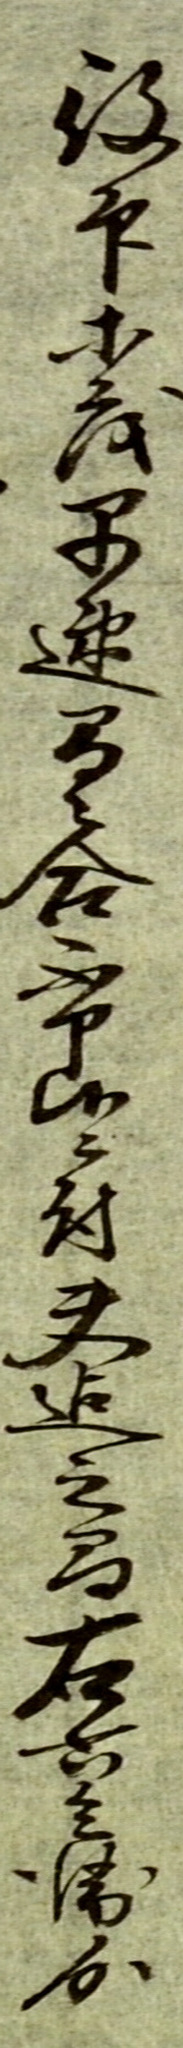役印等茂早速間ニ合不申候ニ付夫迄之間右六兵衛ゟ
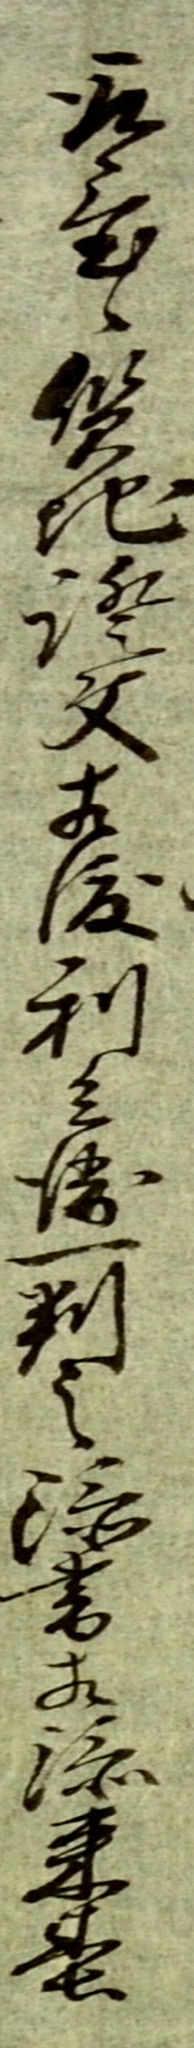取置候質地証文相渡利兵衛一判之添書相添来春
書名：乍恐以口上書奉申上候御事
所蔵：伊那市立高遠町図書館・合同会社AMANE
